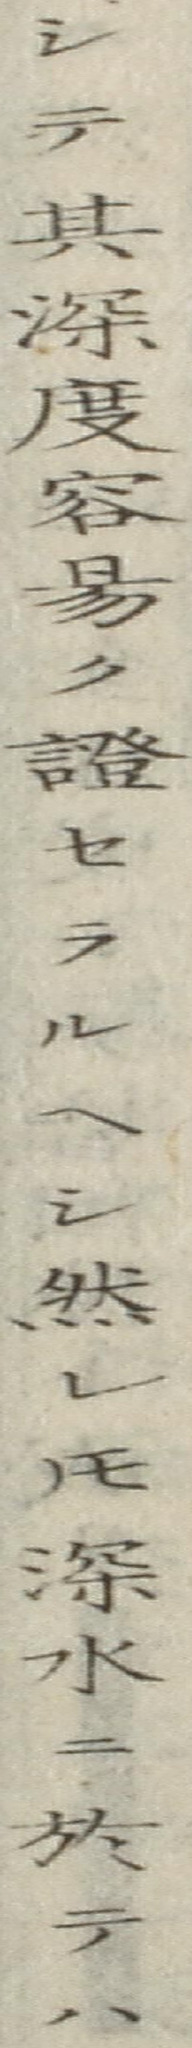シテ其深度容易ク証セラルヘシ然レトモ深水ニ於テハ
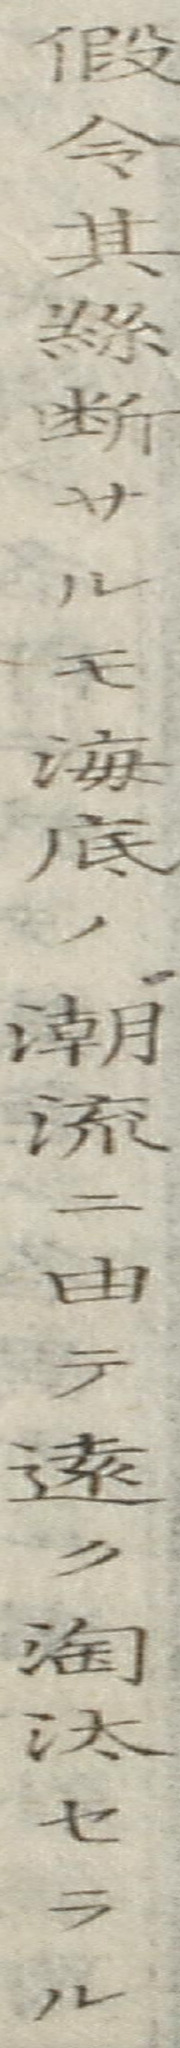假令其糸断サルモ海底ノ潮流ニ由テ遠ク淘汰セラル
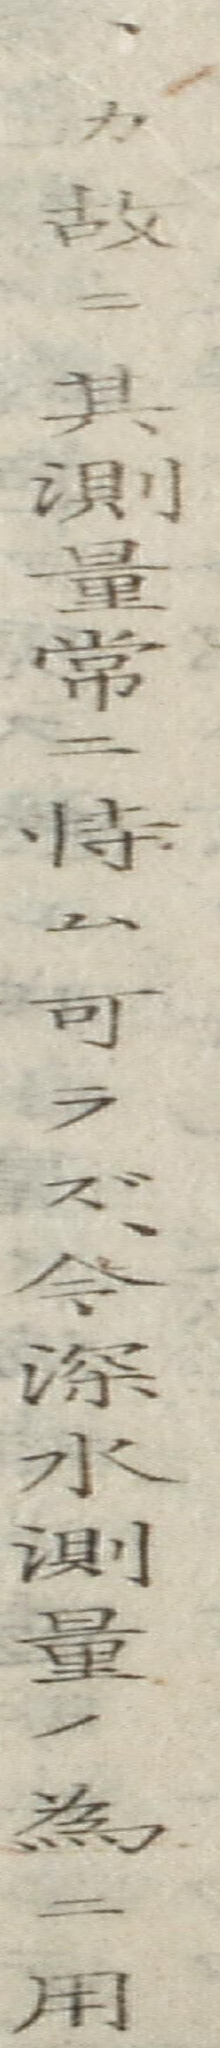ヽカ故ニ其測量常ニ恃ム可ラズ、今深水測量ノ為ニ用
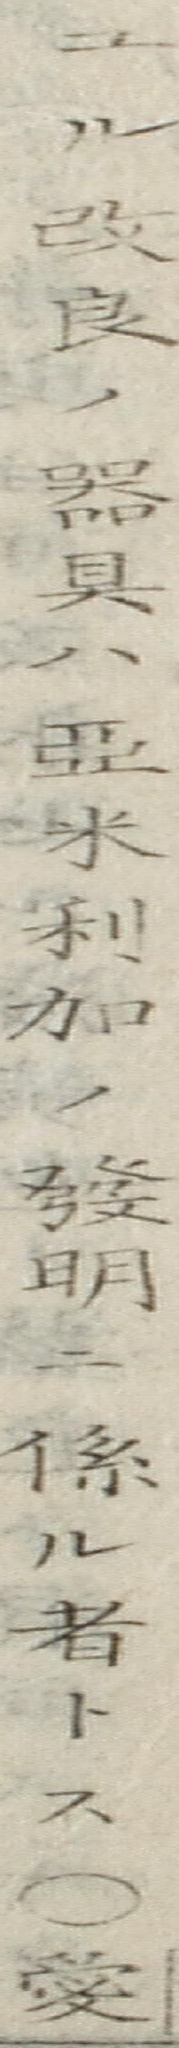ユル改良ノ器具ハ亜米利加ノ発明ニ係ル者トス○愛
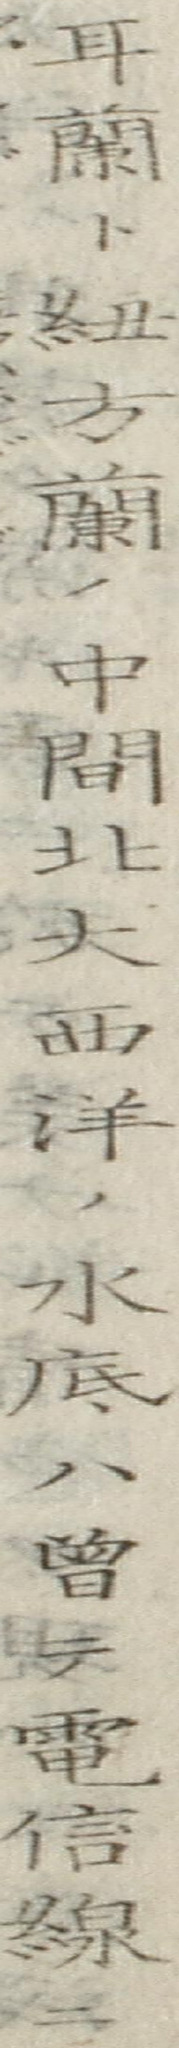耳蘭ト紐方蘭ノ中間北大西洋ノ水底ハ曾テ電信線ニ
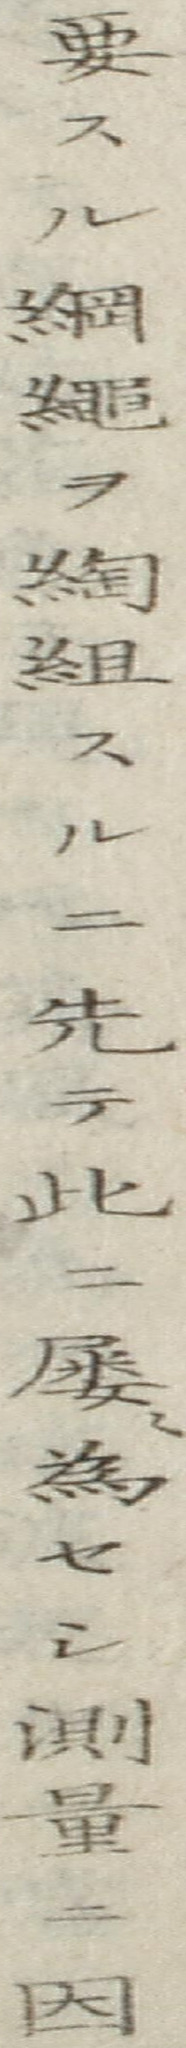要スル網縄ヲ綯組スルニ先テ此ニ屡々為セシ測量ニ因
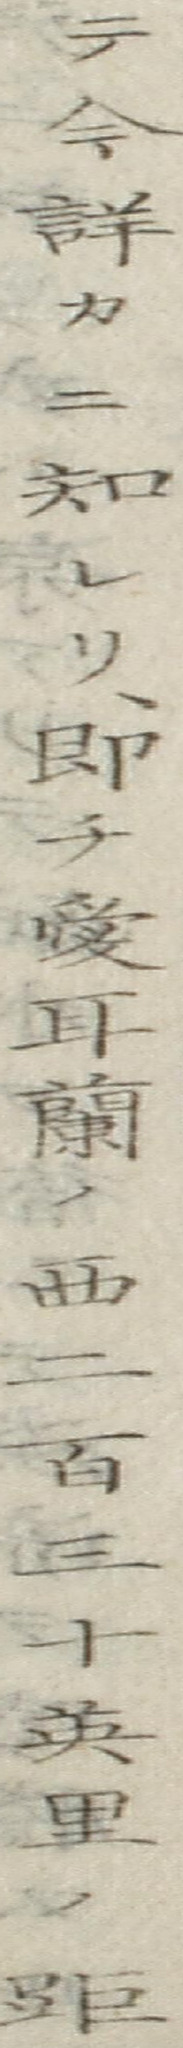テ今詳カニ知レリ、即チ愛耳蘭ノ西二百三十英里ノ距
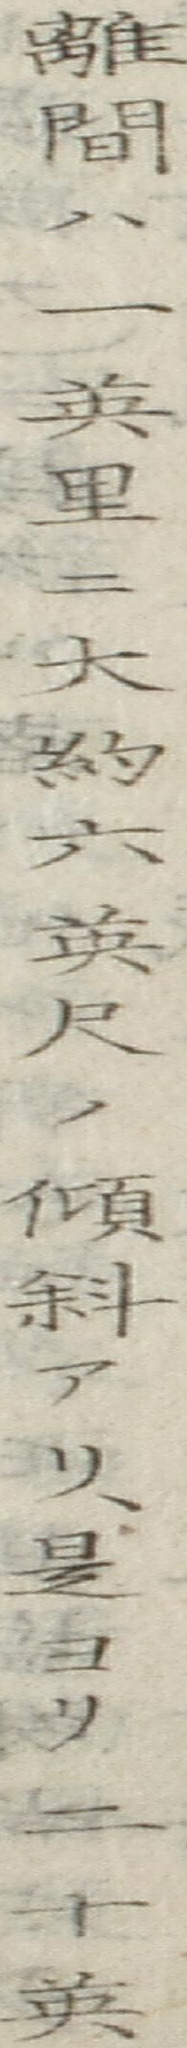離間ハ一英里ニ大約六英尺ノ傾斜アリ、是ヨリ二十英
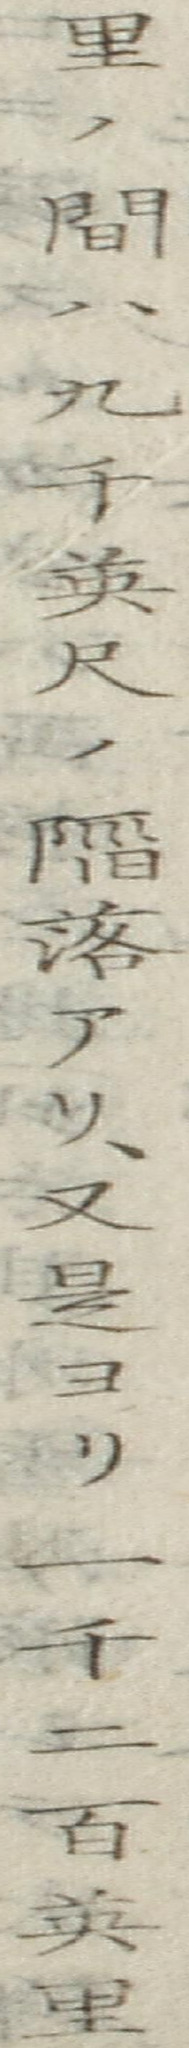里ノ間ハ九千英尺ノ陥落アリ、又是ヨリ一千二百英里
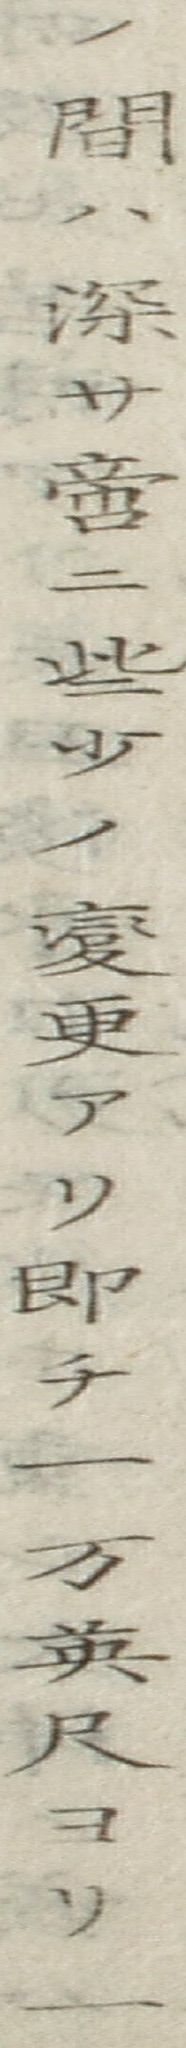ノ間ハ深サ啻ニ些少ノ変更アリ即チ一万英尺ヨリ一
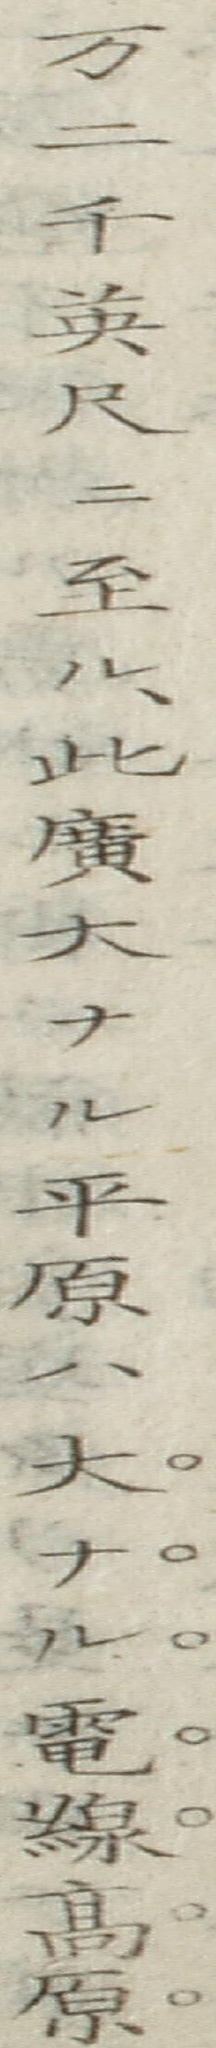万二千英尺ニ至ル、此広大ナル平原ハ大ナル電線高原
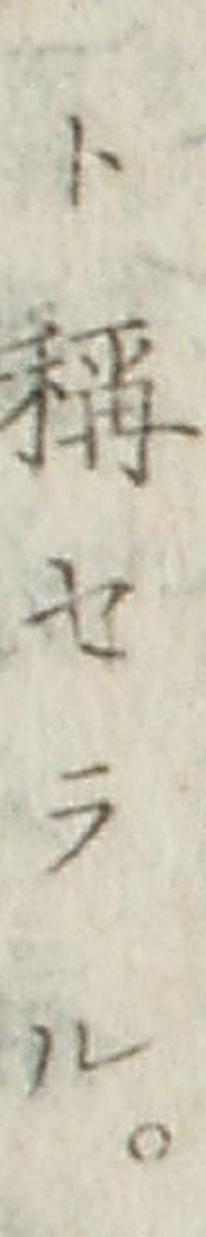ト稱セラル。
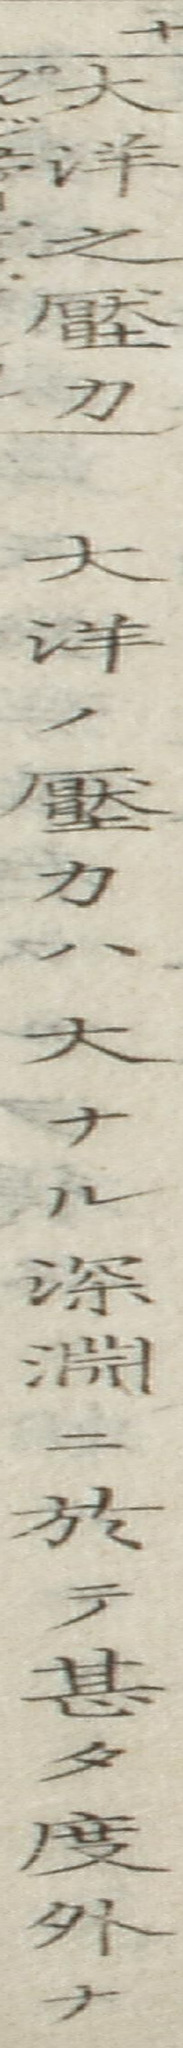十〔大洋之圧力〕大洋ノ圧力ハ大ナル深淵ニ於テ甚タ度外ナ
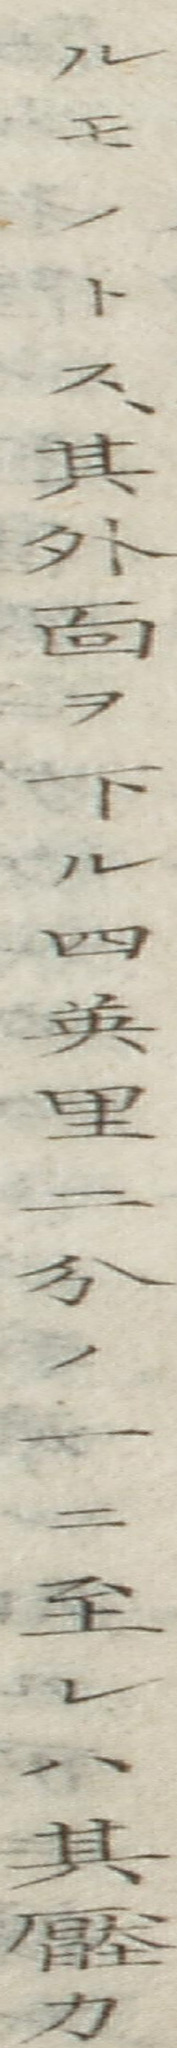ルモノトス、其外面ヲ下ル四英里二分ノ一ニ至レハ其圧力
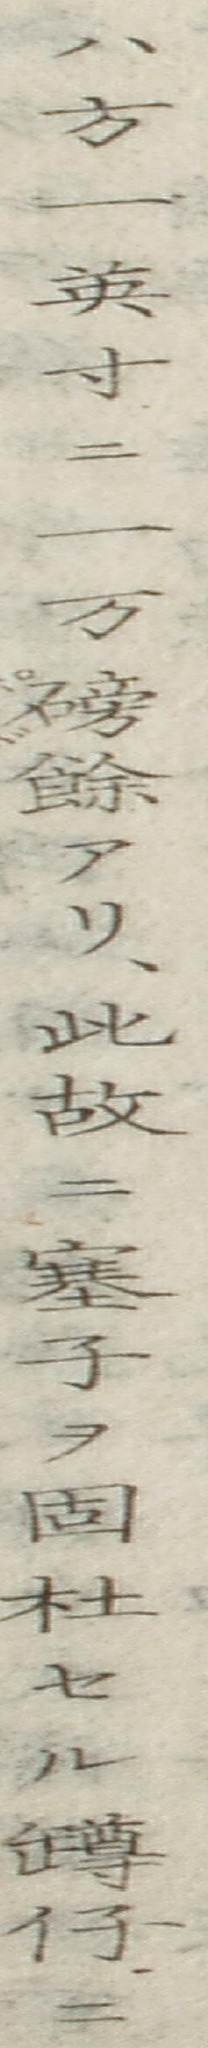ハ方一英寸ニ一万磅余アリ、此故ニ塞子ヲ固杜セル罇仔ニ
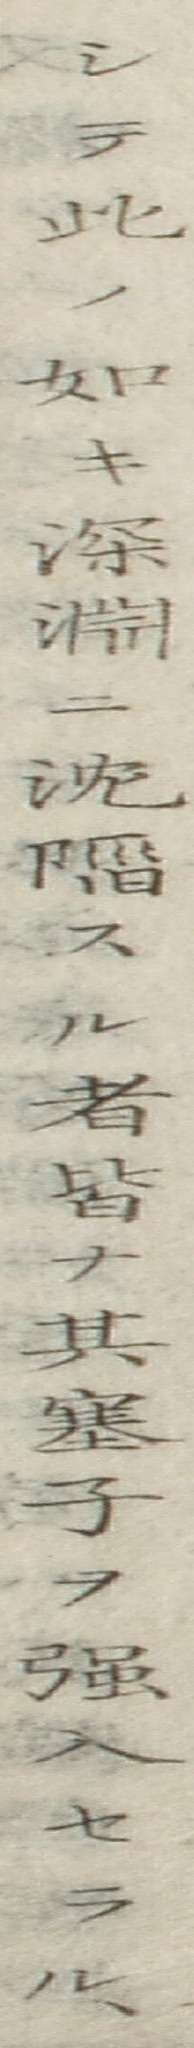シテ此ノ如キ深淵ニ沈陥スル者皆ナ其塞子ヲ強入セラル、
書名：地形論　巻二
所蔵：東京大学地震研究所図書室 Earthquake Research Institute Library, The University of Tokyo, JAPAN
